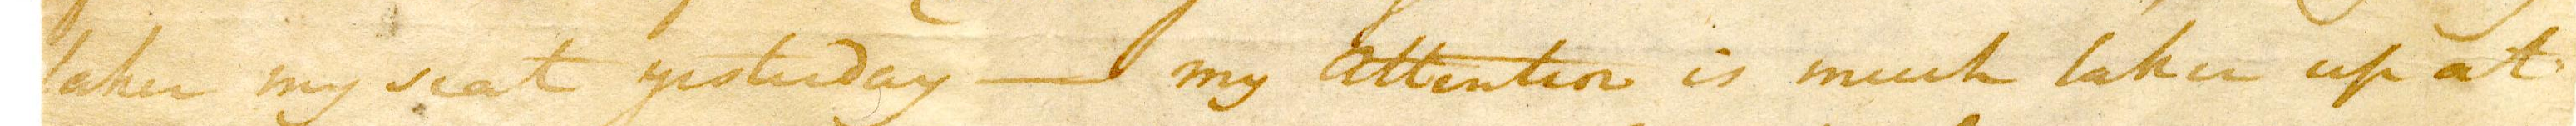taken my seat yesterday- my attention is much taken up at
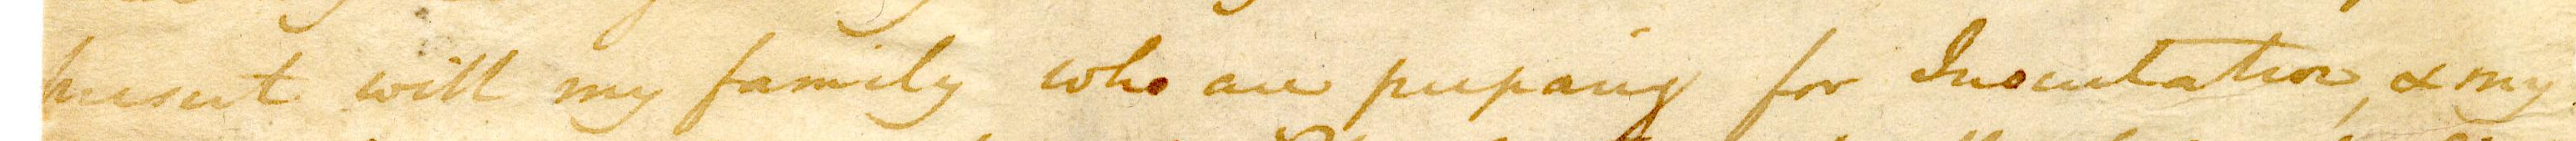present with my family who are preparing for Inoculation & my
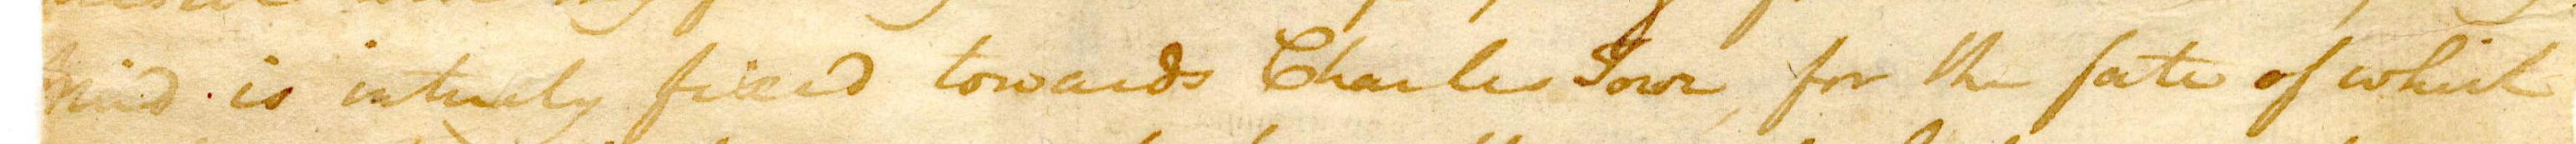mind is intently fixed towards Charles Town for the fate of which
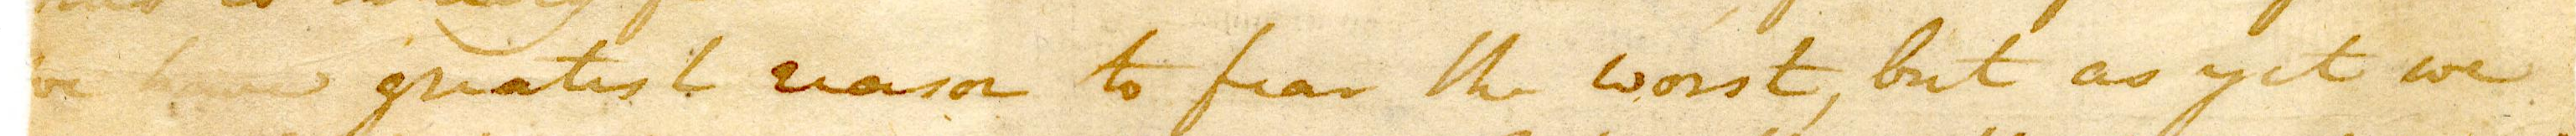we have greatest reason to fear the worst, but as yet we
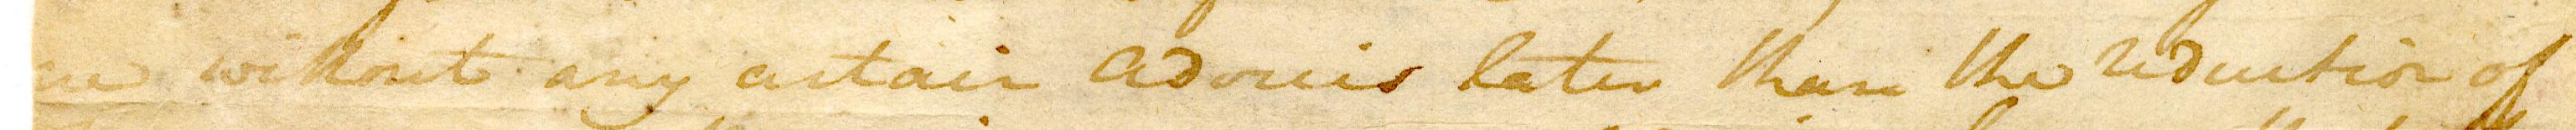are without any certain Advices later than the reduction of
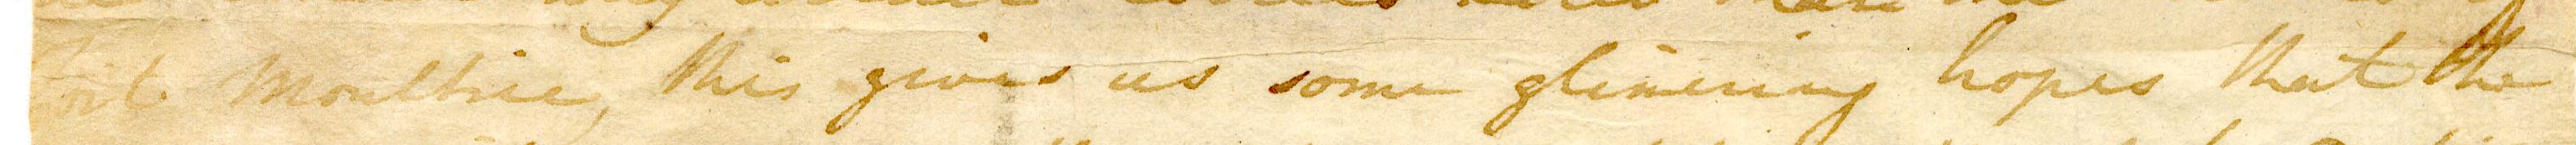Fort Moultrie, this gives us some glimmering hopes that the
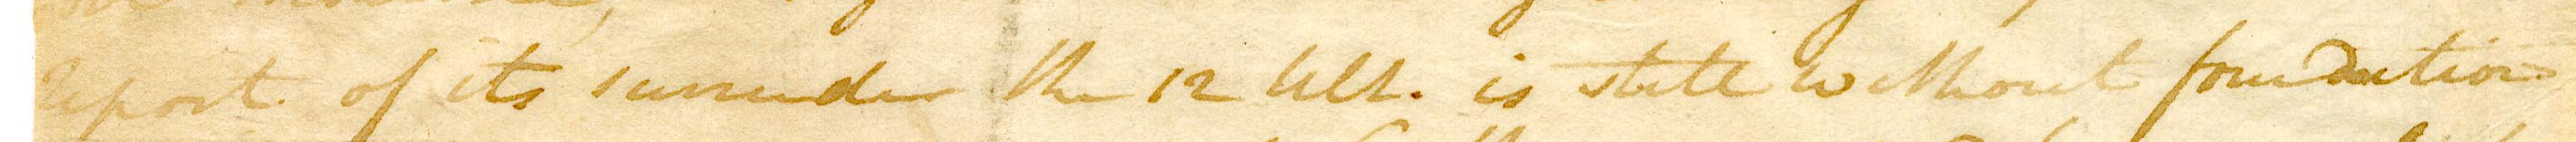report of its surrender the 12 Ult. is still without foundation
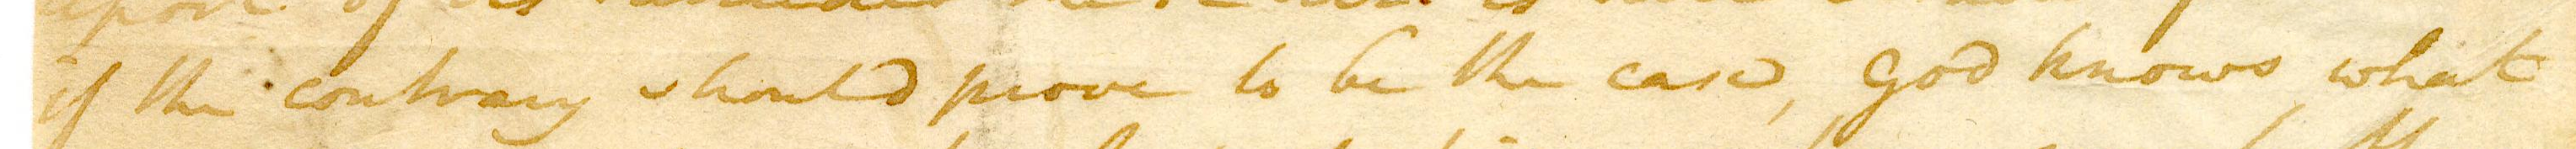if the contrary should prove to be the case god knows what
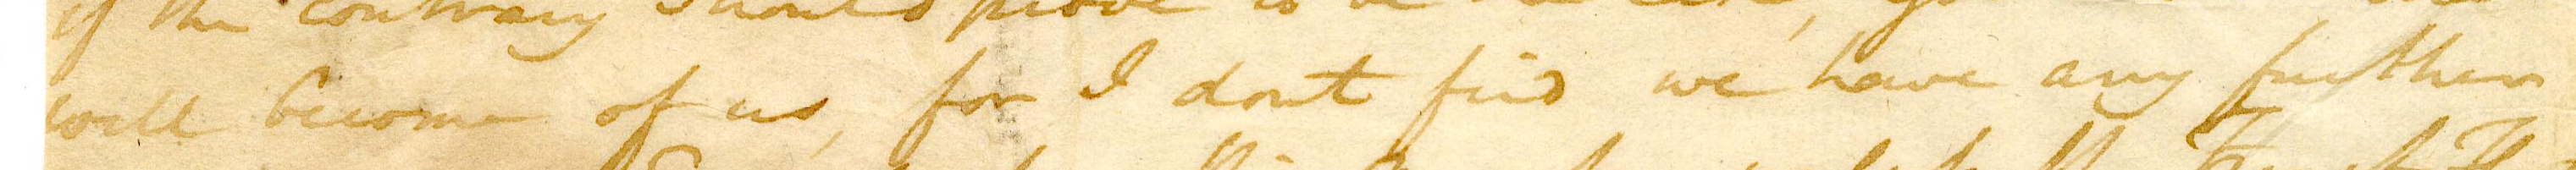will become of us, for I dont find we have any further
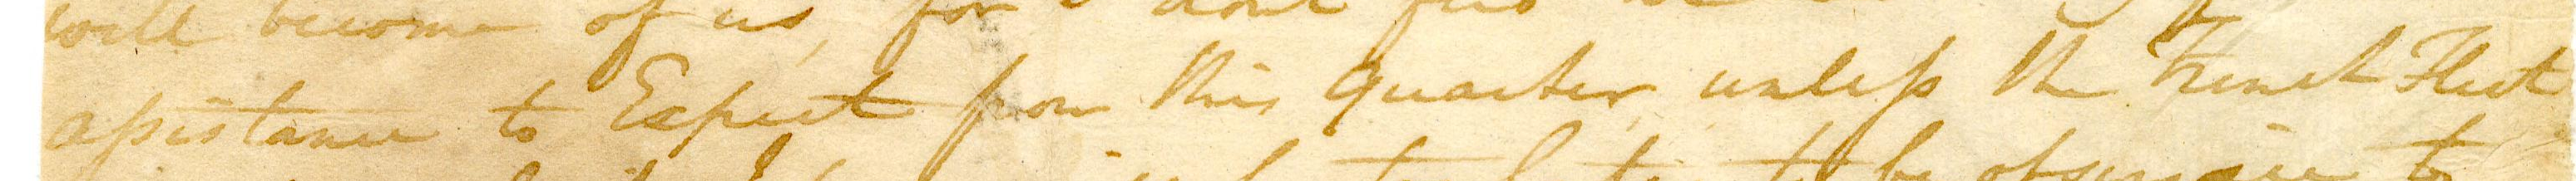assistance to Expect from this Quarter unless the French Fleet
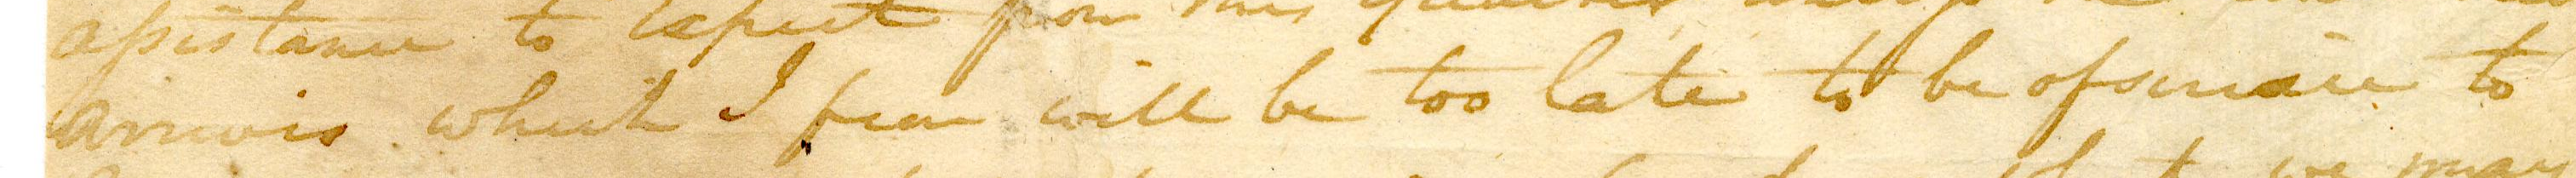Arrives which I fear will be too late too be of service to
